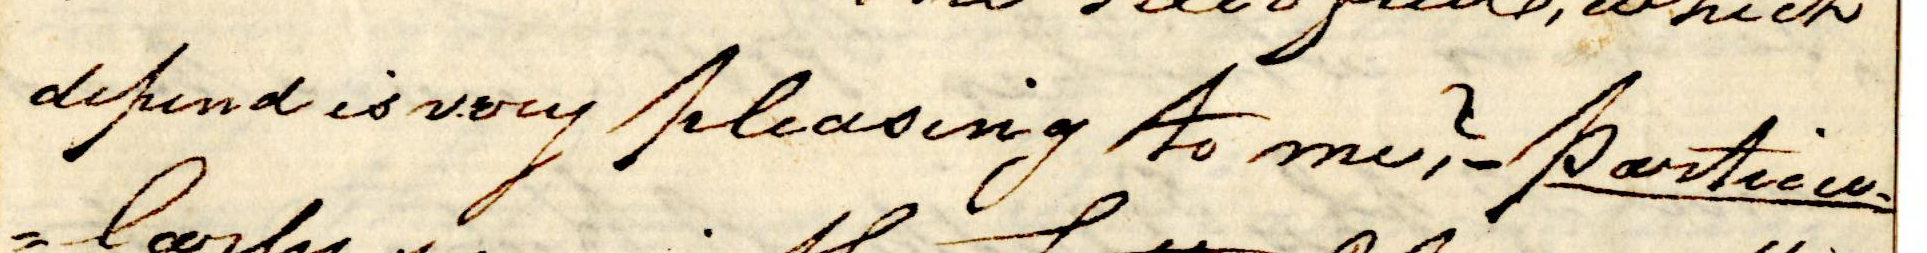depend is very pleasing to me.- particu-
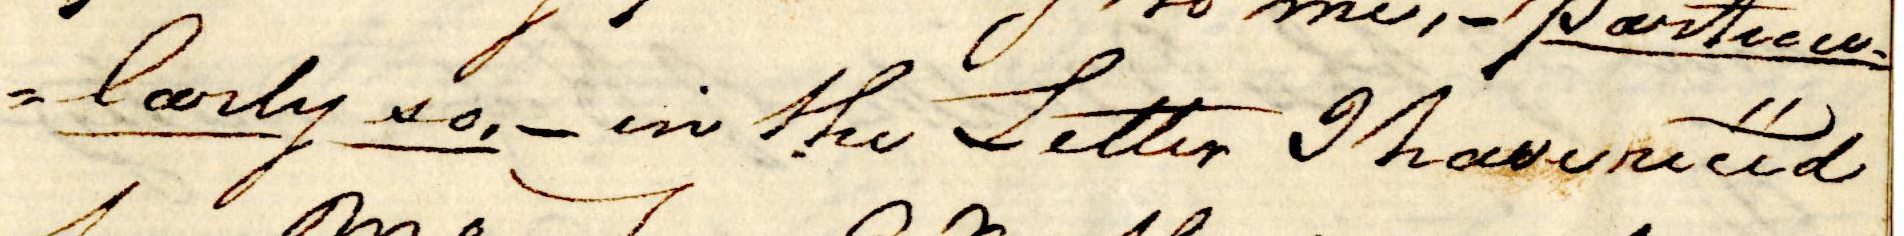-larly so.- in the Letter I have rece^d
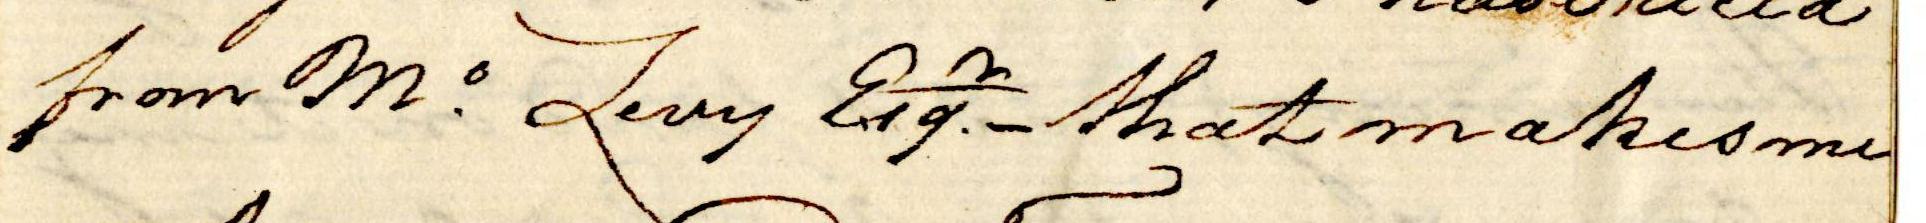from M^r Levy Esq^r.- that makes me
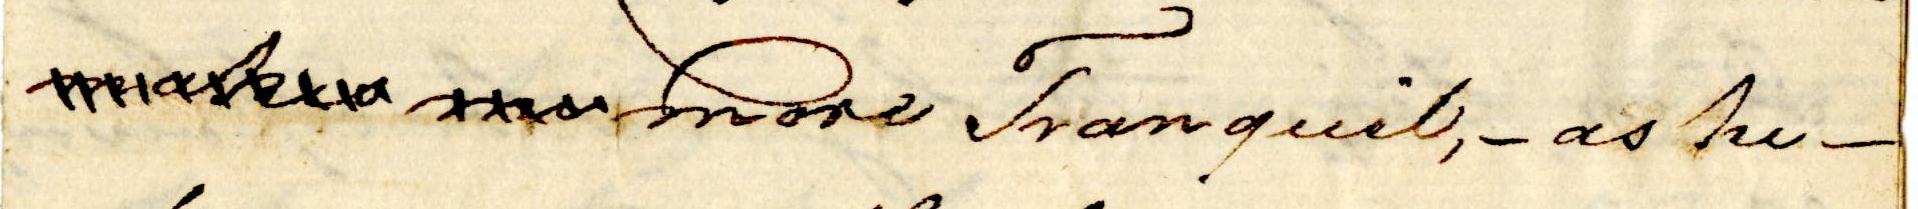[makes] [me] more Tranquil,- as he -
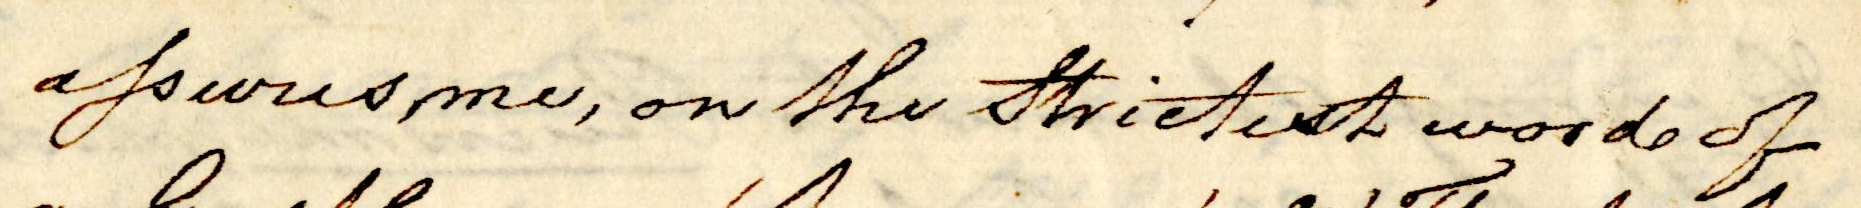assures me, on the Strictest words of
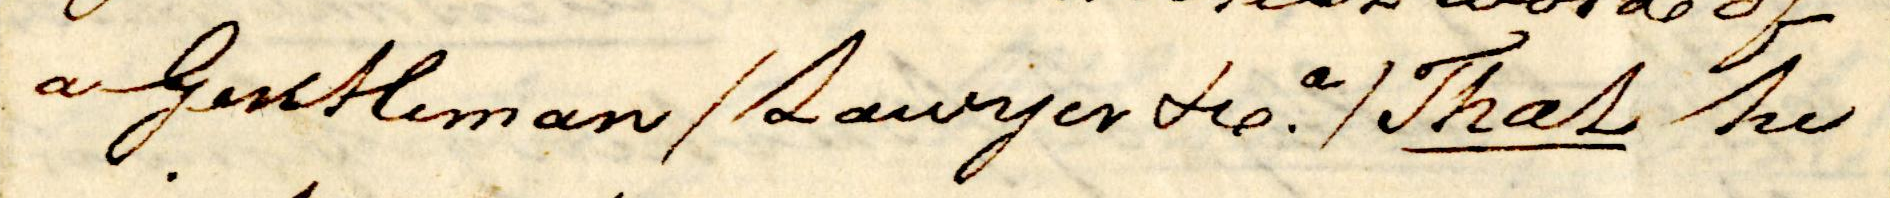a gentleman (Lawyer &c^a) That he
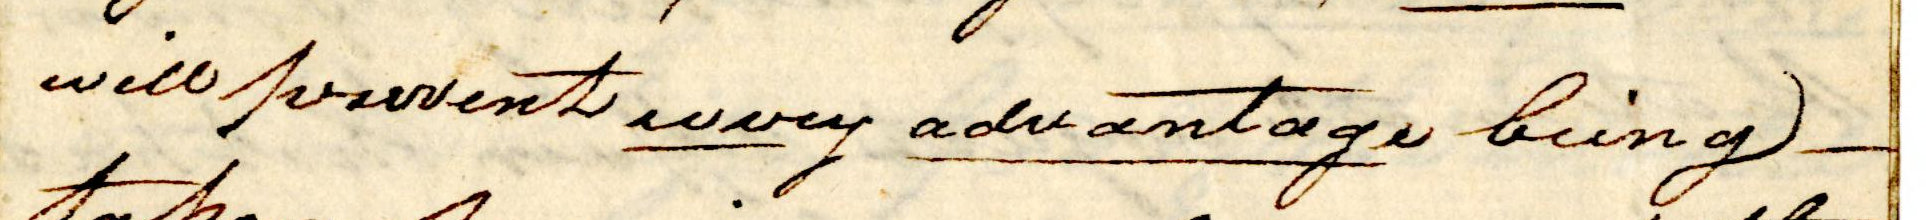will prevent every advantage being
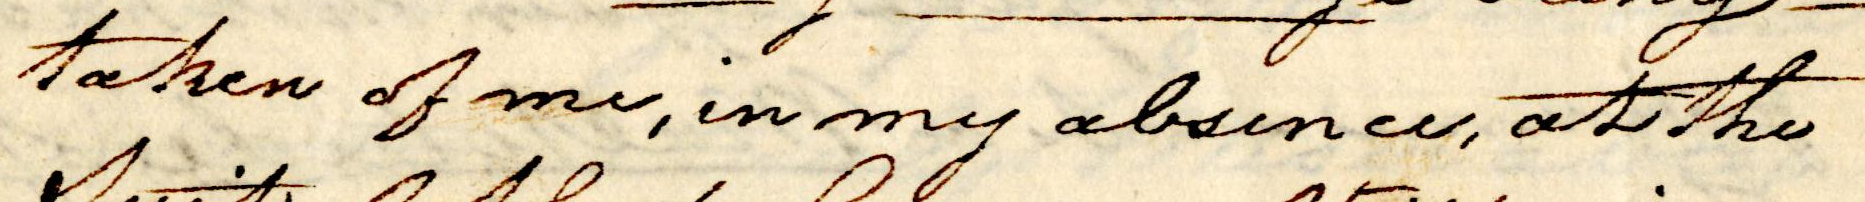taken of me, in my absence, at the
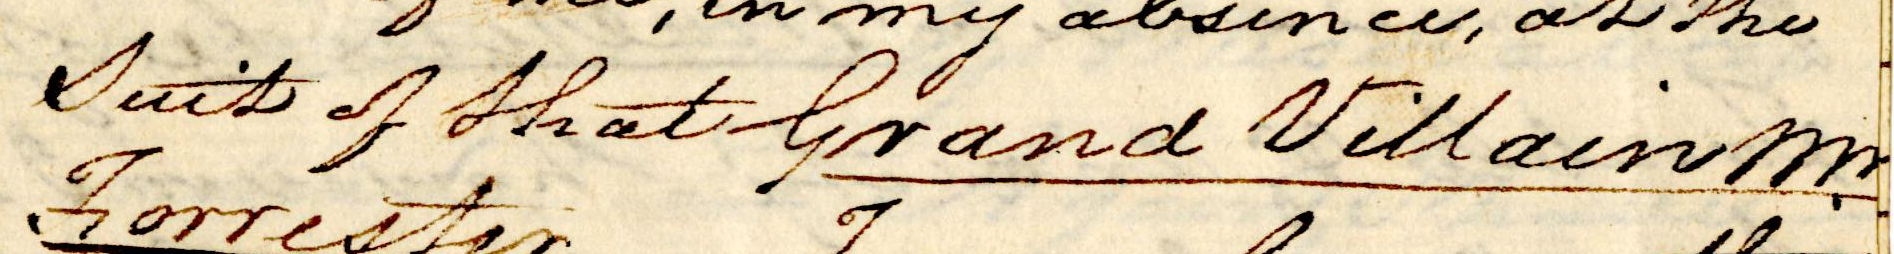Suit of that Grand Villain M^r
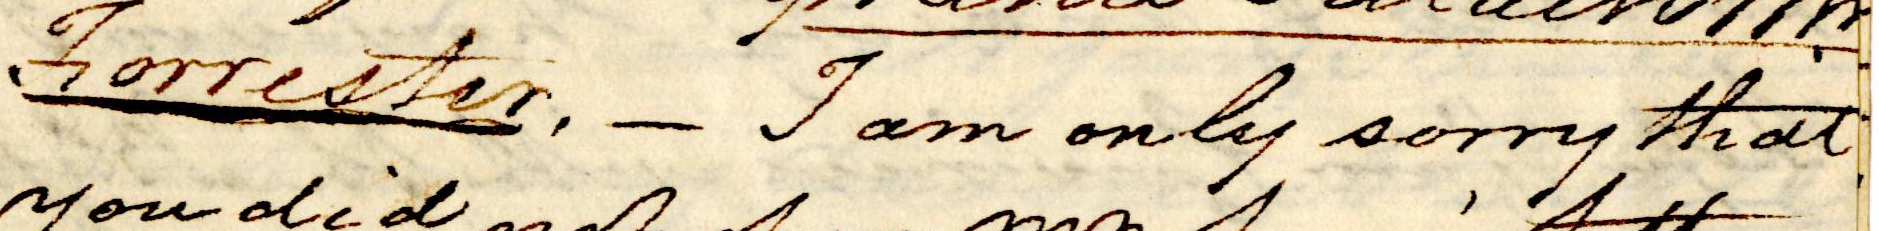Forrester.- I am only sorry that
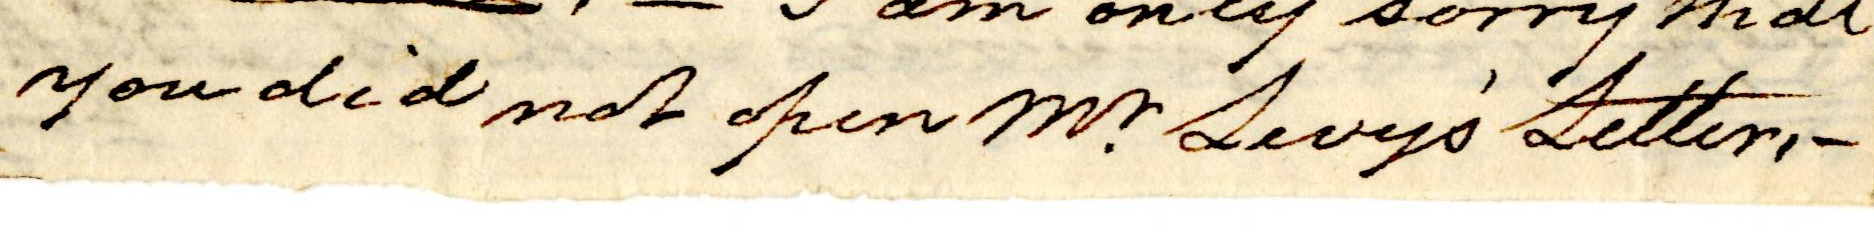you did not open M^r Levy's Letter. -
